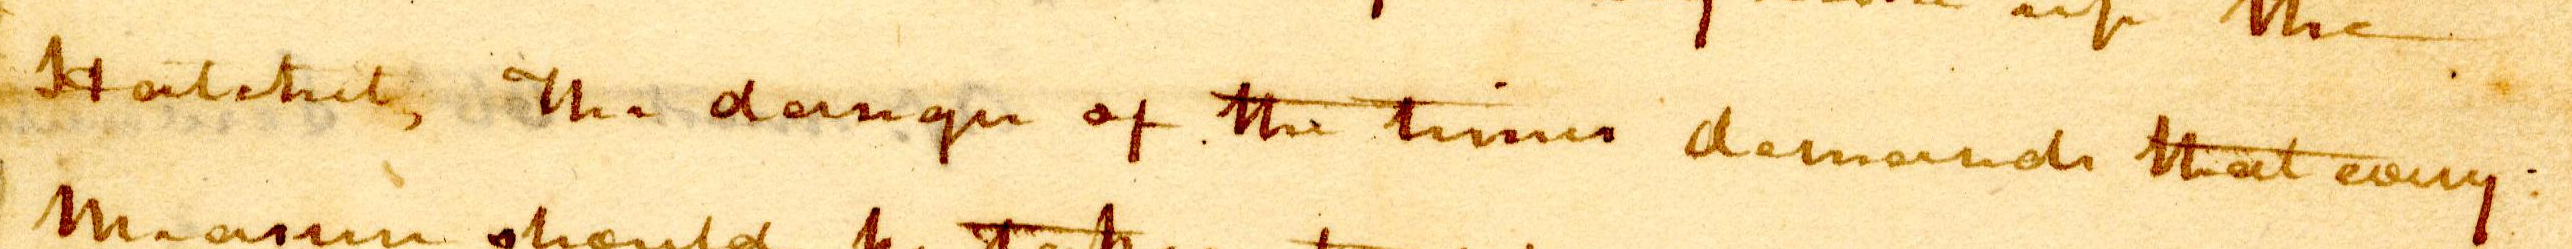Hatchet. The danger of the times demands that every
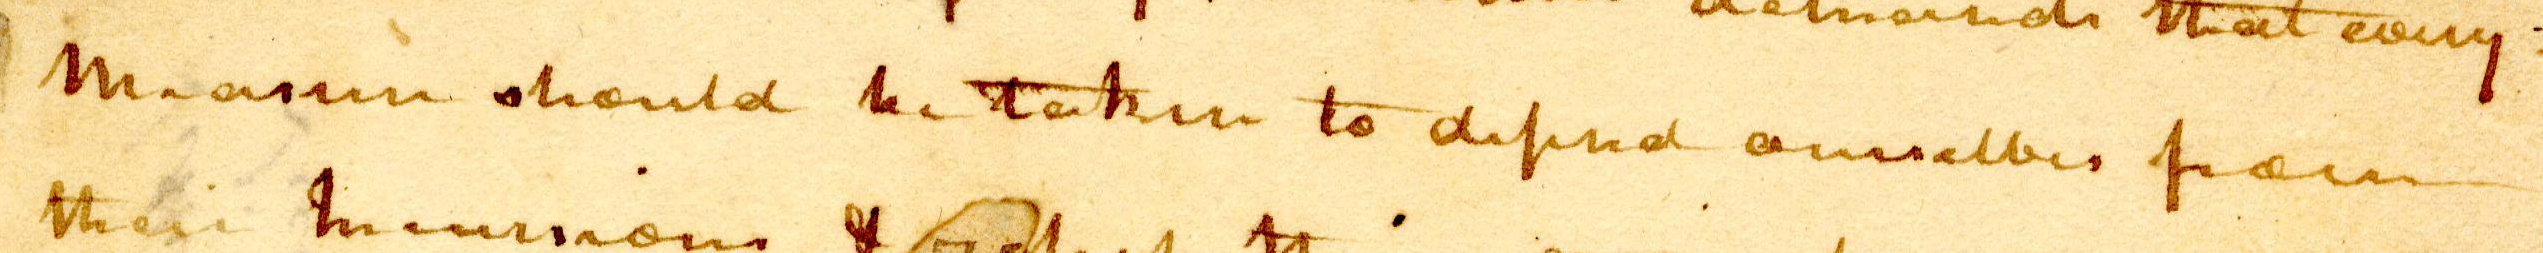Measure should be taken to defend ourselves from
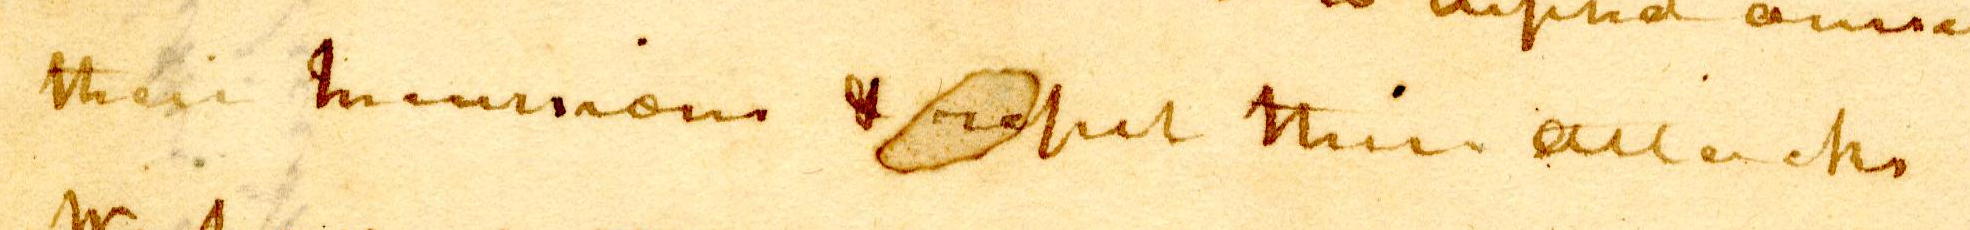their Incursions & repel their attacks
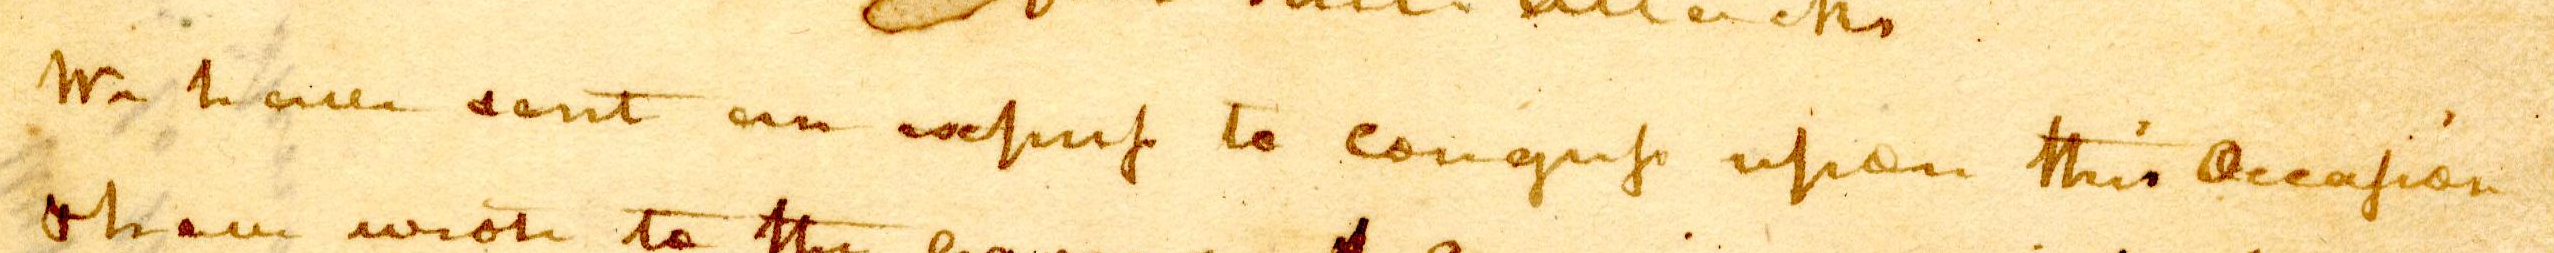We have sent an express to Congress upon this occasion
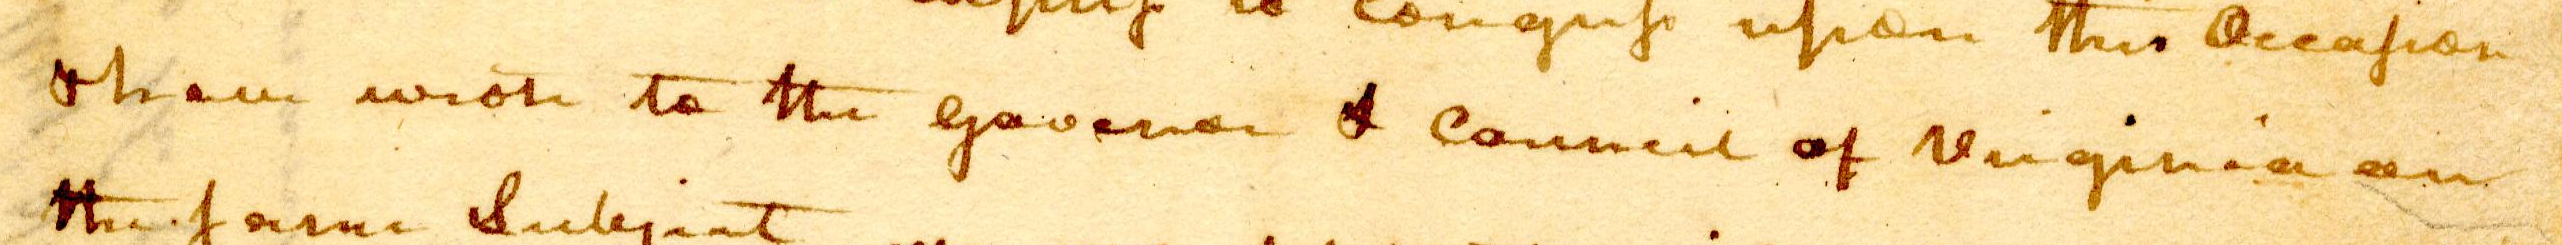& have wrote to the governor & Council of Virginia on
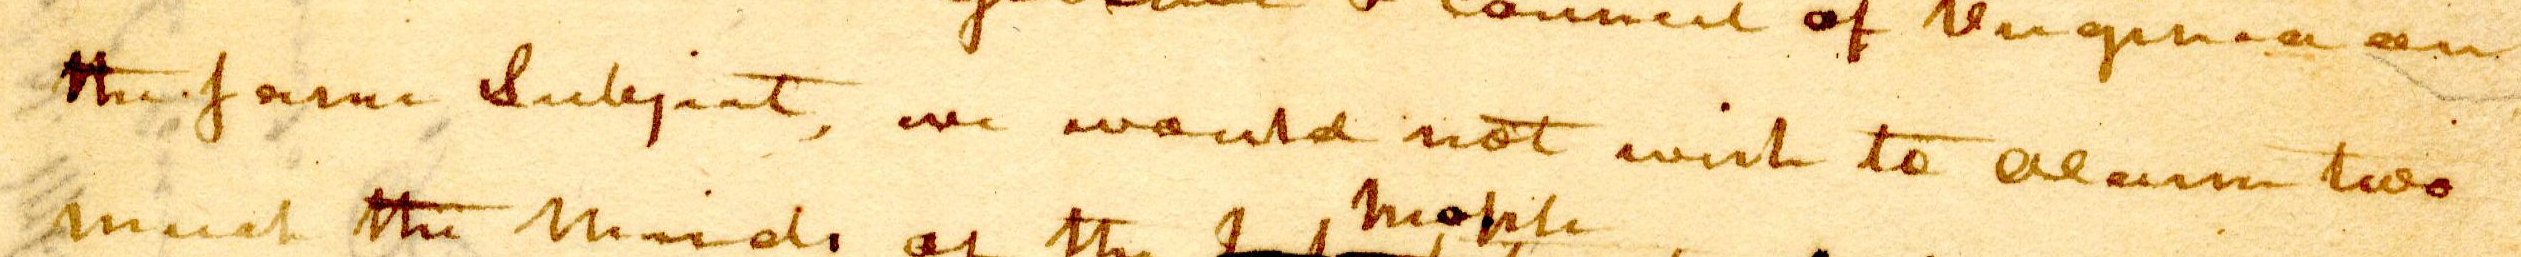the former Subject, we would not wish to alarm two
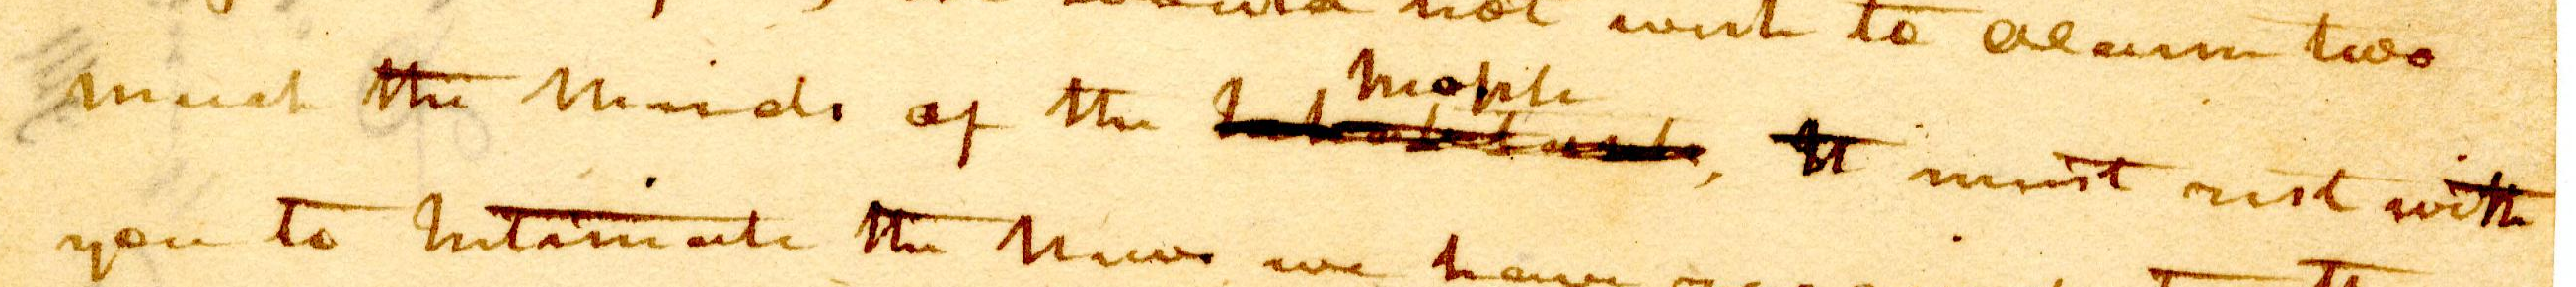much the Minds of the [Inhabitants], & must work with
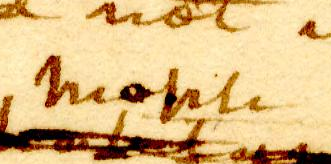people
